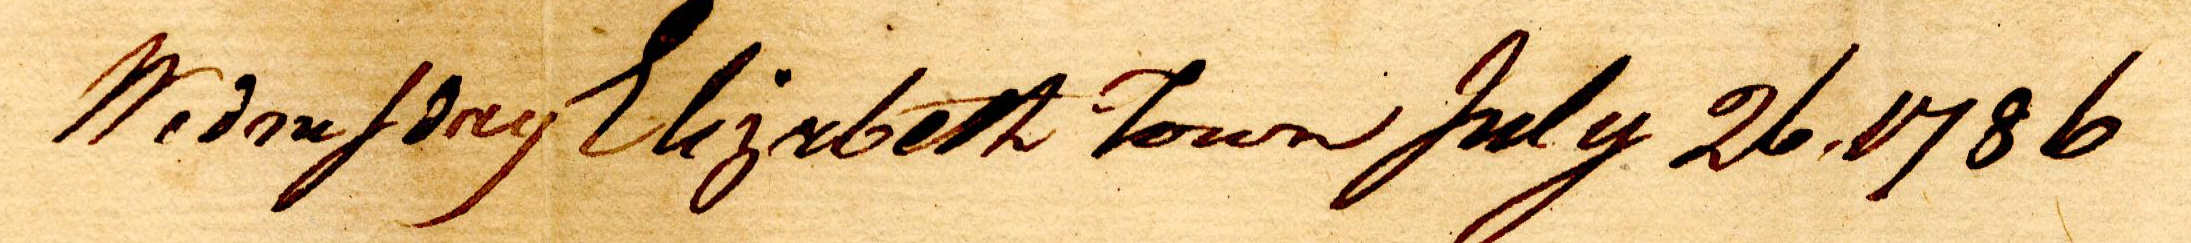Wednesday Elizabeth Town July 26. 1786
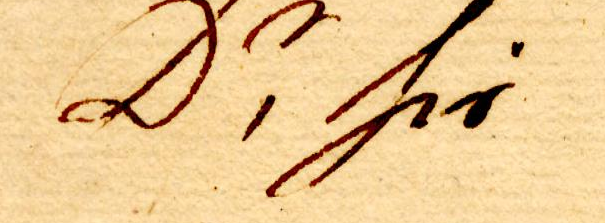D^r. sir
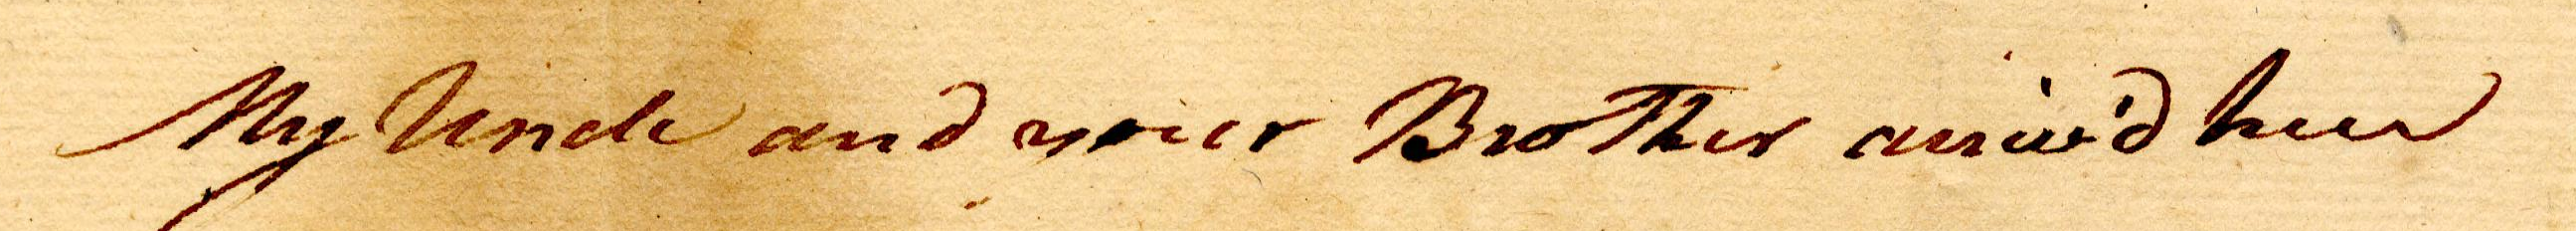My Uncle and your Brother arriv'd heer
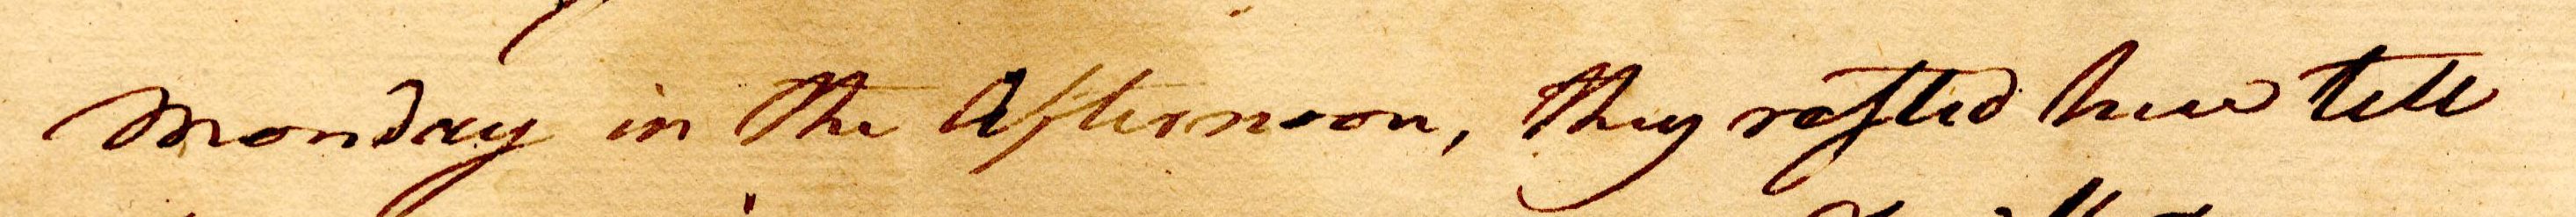monday in the Afternoon, they rested heer till
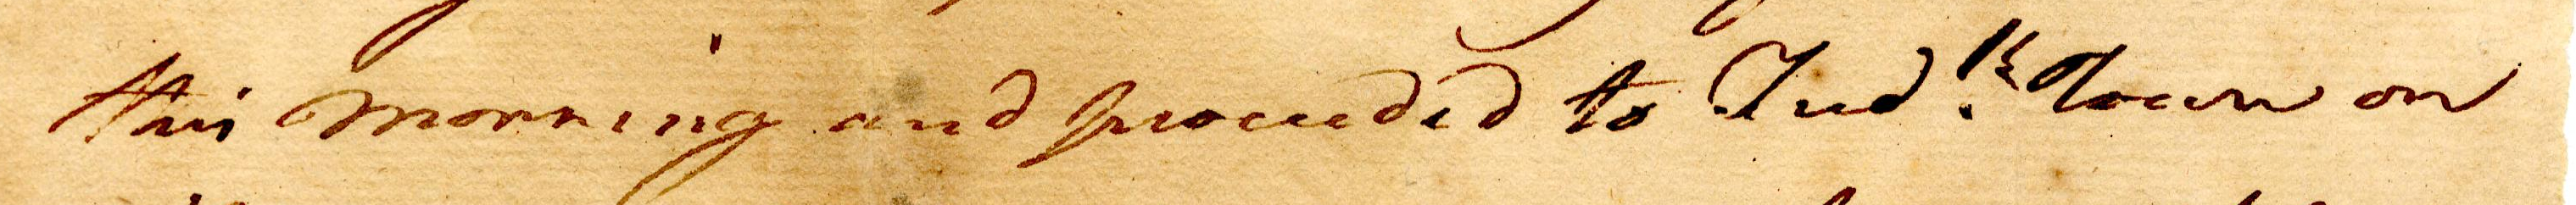this morning and proceeded to Tud^k town on
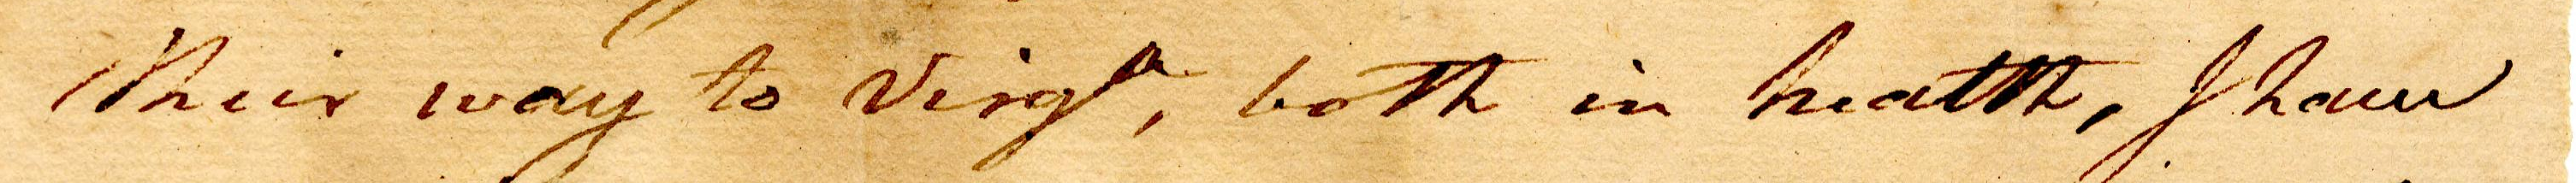their way to Virg^a, both in health, I have
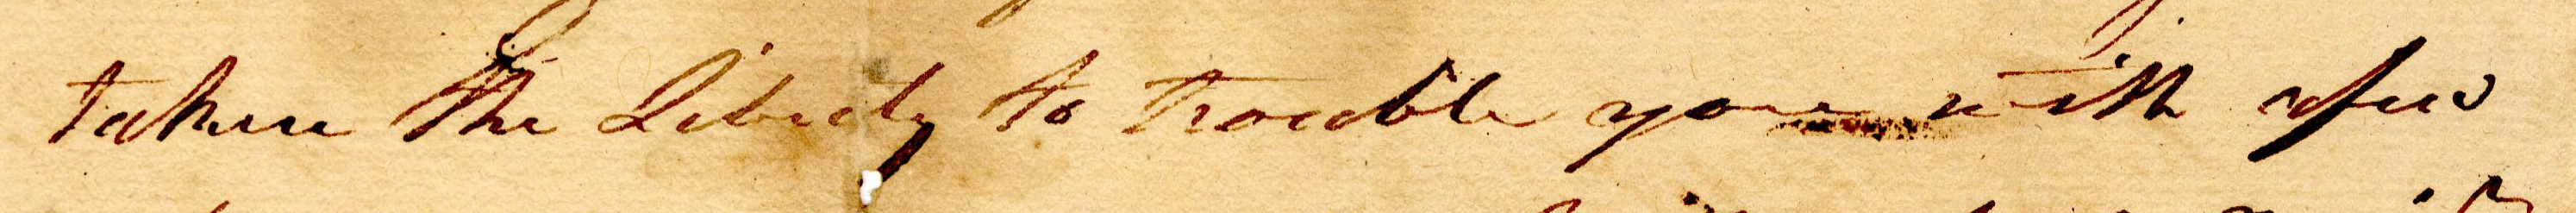taken the Liberty to trouble you with a few
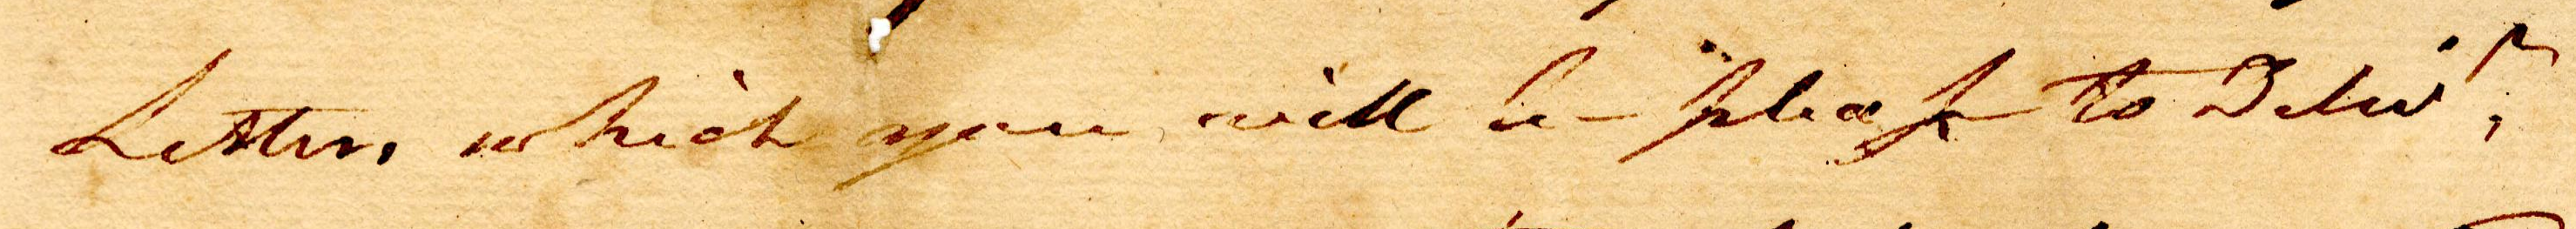Letters, which you will be please to Deliv^r.
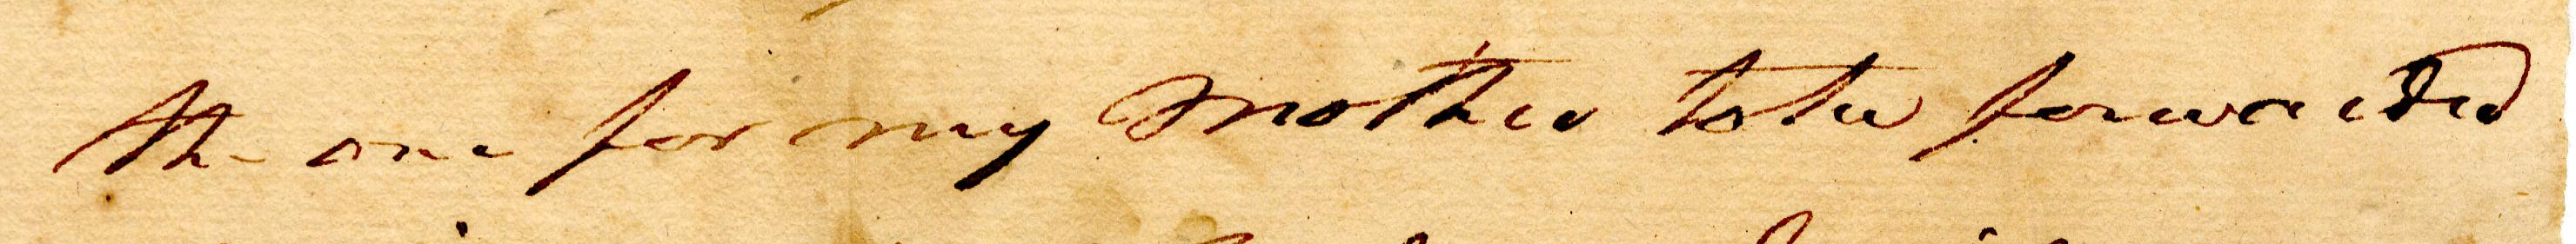the one for my mother to the forwarded
